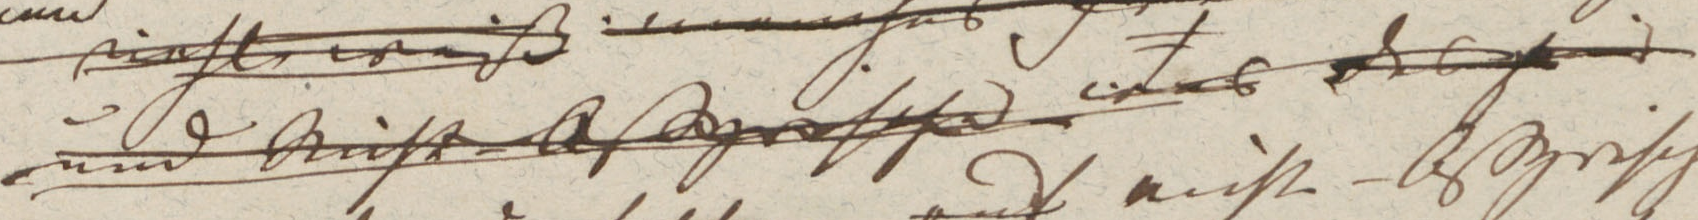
und Nicht-Assyrische was das für %
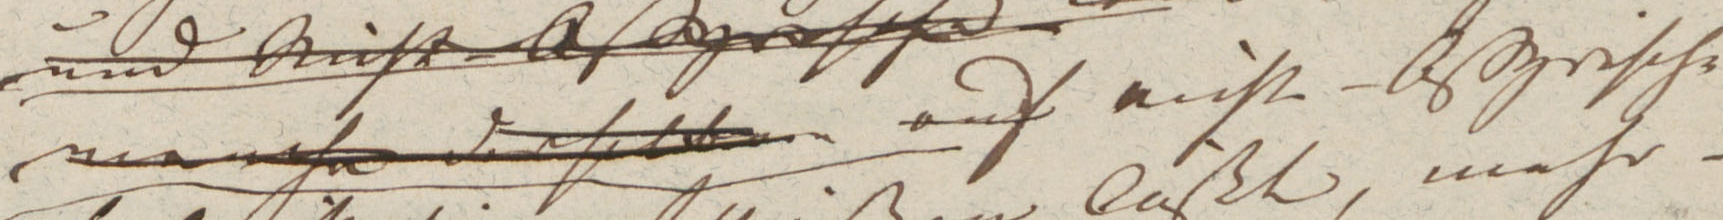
manche derselben auf nicht-Assyrische
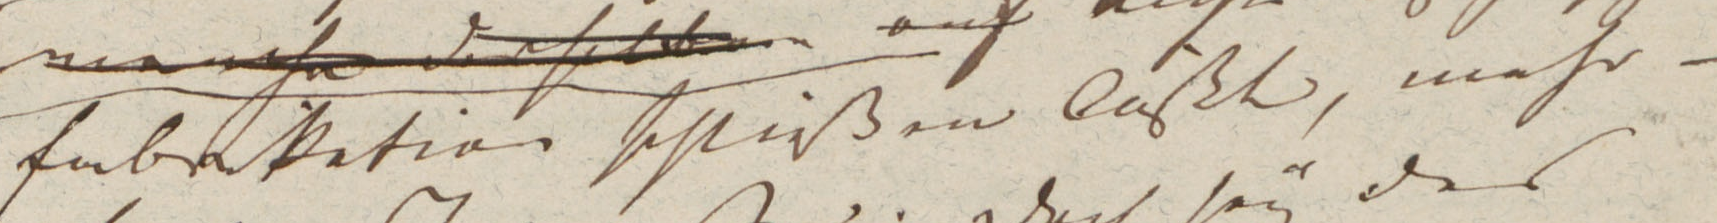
Fabrikation schliessen lässt, mehr-
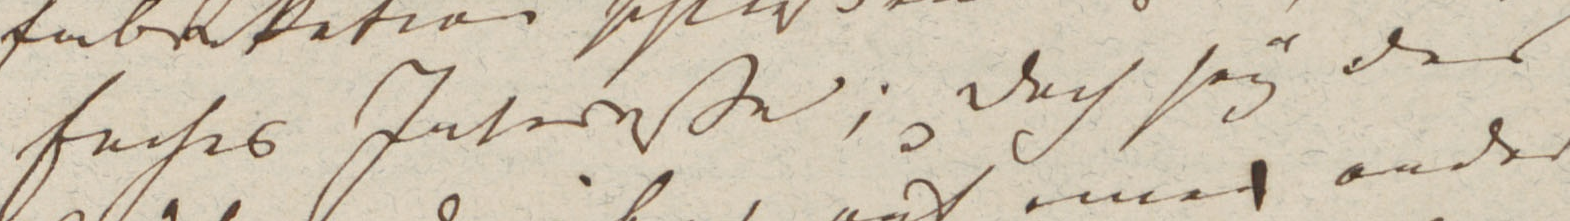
faches Interesse; Doch sey das
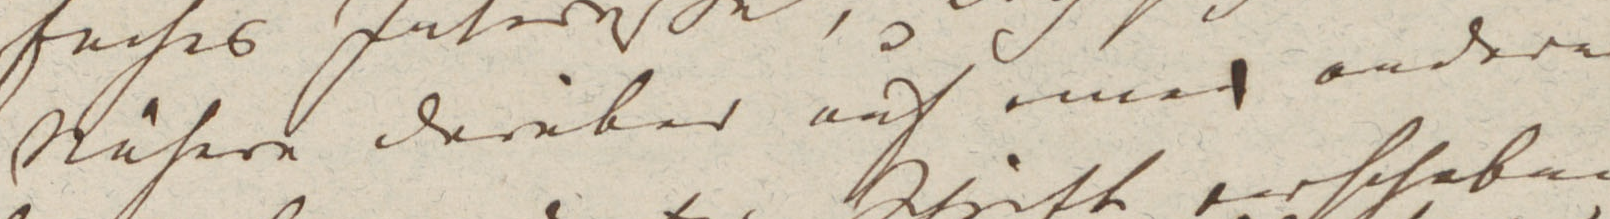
Nähere darüber auf eine andere
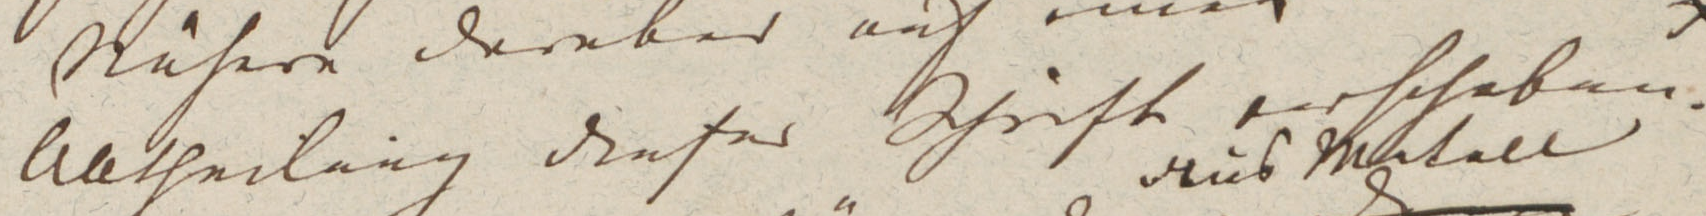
Abtheilung dieser Schrift verschoben. %
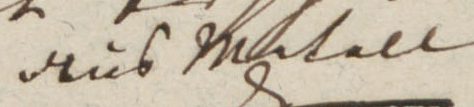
ihnen dDargestellten
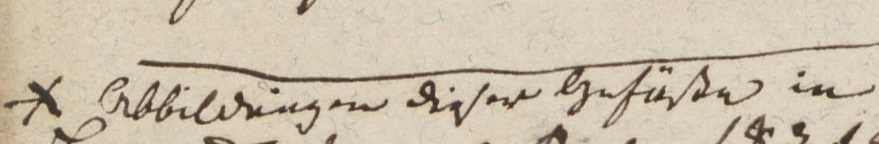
% Abbildungen dieser Gefässe in
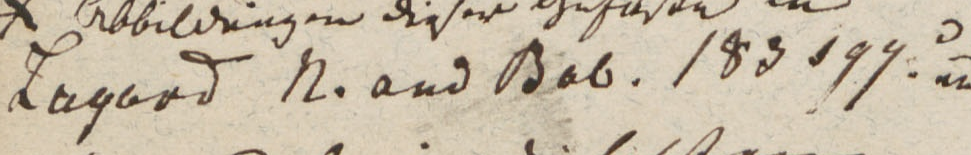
Layard N. and Bab. 183 sqq. und
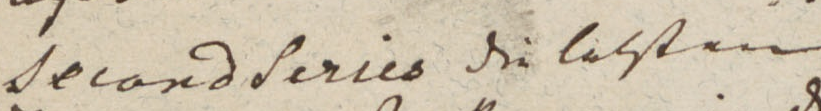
second Series die letzten
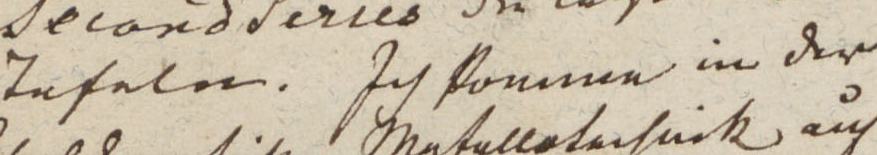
Tafeln. Ich komme in der
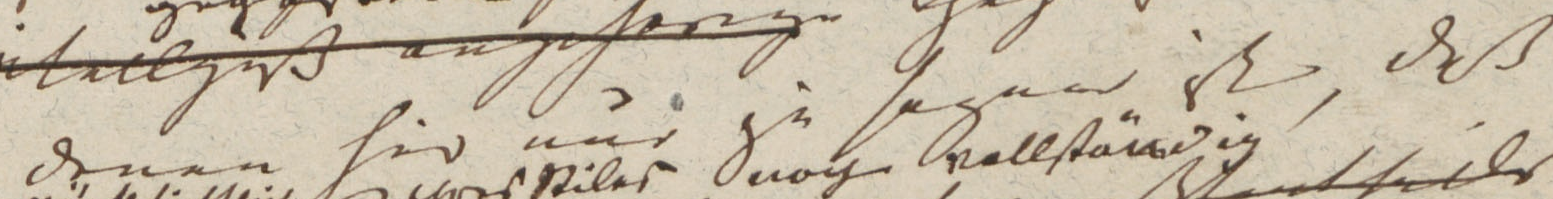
denen hier nur zu sagen ist, dass
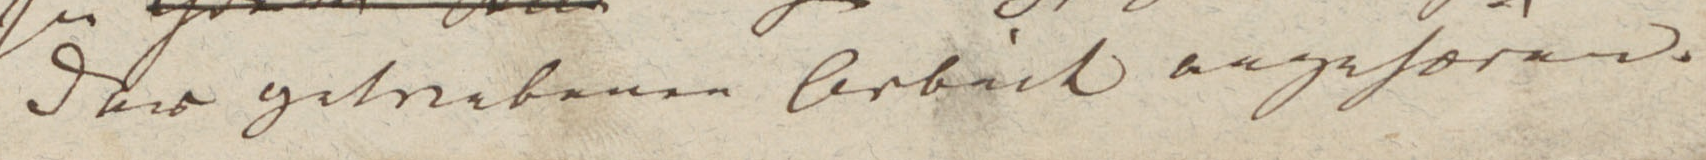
der getriebenen Arbeit angehören.
